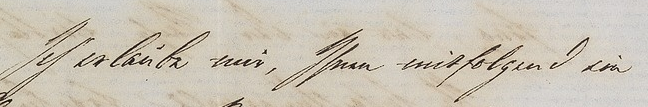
Ich erlaube mir, Ihnen mitfolgend ein
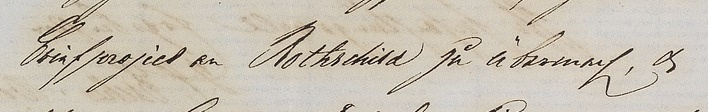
Briefproject an Rothschild zu übermachen, &
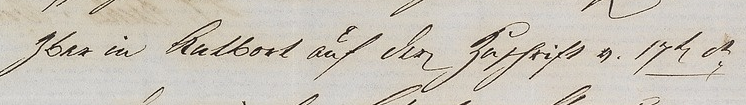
zwar in Antwort auf deren Zuschrift v. 17ten ct.
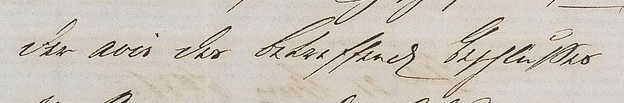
Der avis des betreffenden Beschlusses
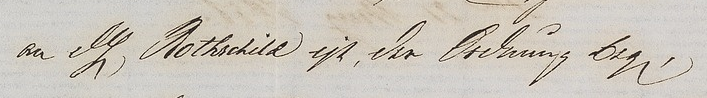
den Herrn Rothschild ist, der Ordnung wegen,
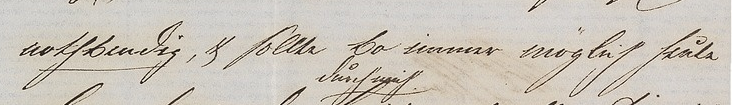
nothwendig, & sollte wo immer möglich heute
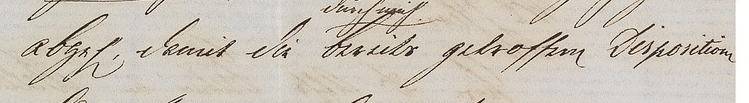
abgehen, damit die durch mich bereits getroffenen Dispositionen
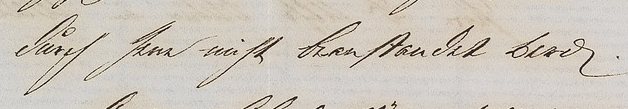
durch Jene nicht beanstandet werden. –
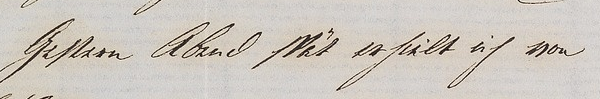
Gestern Abend spät erhielt ich von
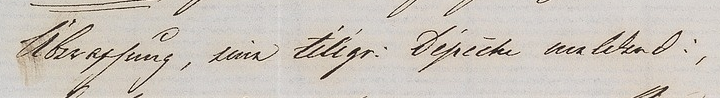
Überaschung, eine télégr. Dépèche meldend:
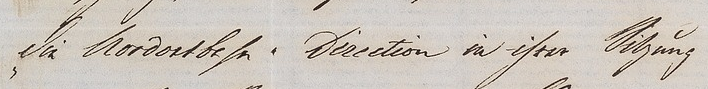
«Die Nordostbahn-Direction in ihrer Sitzung
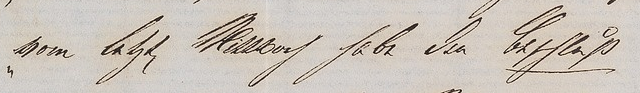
vom letzten Mittwoch habe den Beschluß
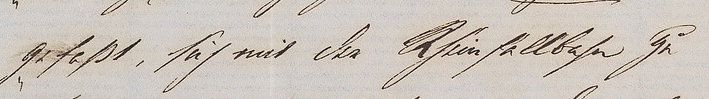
gefaßt, sich mit der Rheinfallbahn zu
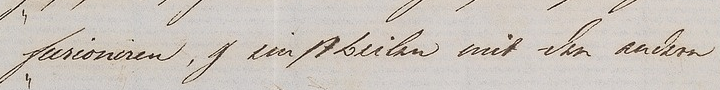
fusioniren, & einstweilen mit den andern
